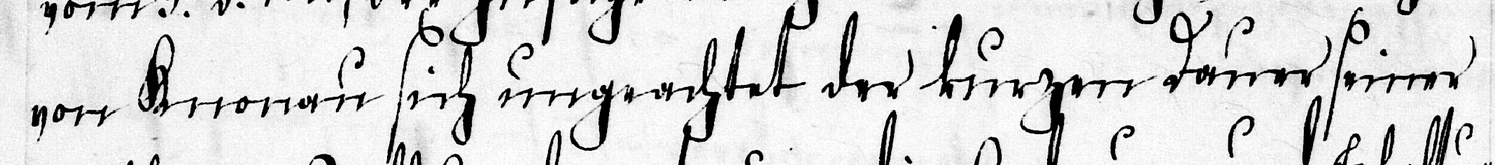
von Knonau sich ungeachtet der kurzen Dauer seiner
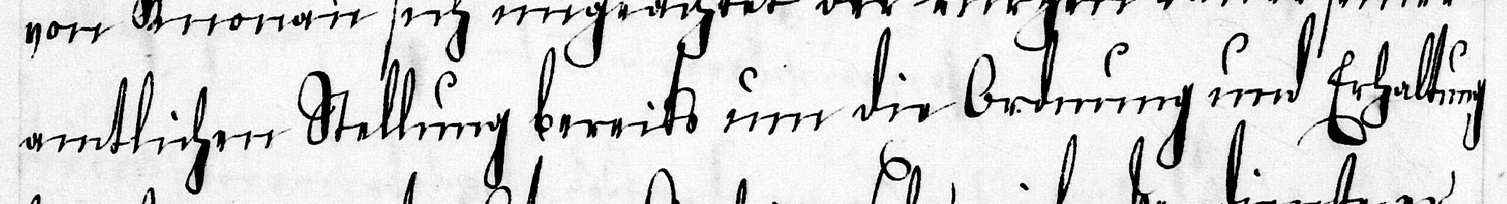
amtlichen Stellung bereits um die Ordnung und Erhaltung
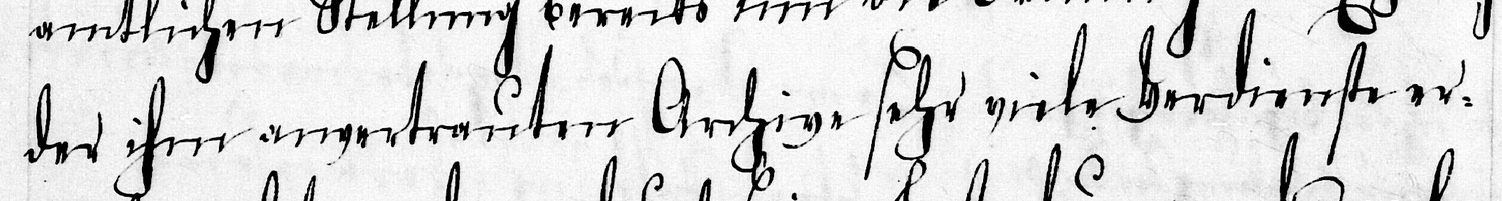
der ihm anvertrauten Archive sehr viele Verdienste er¬
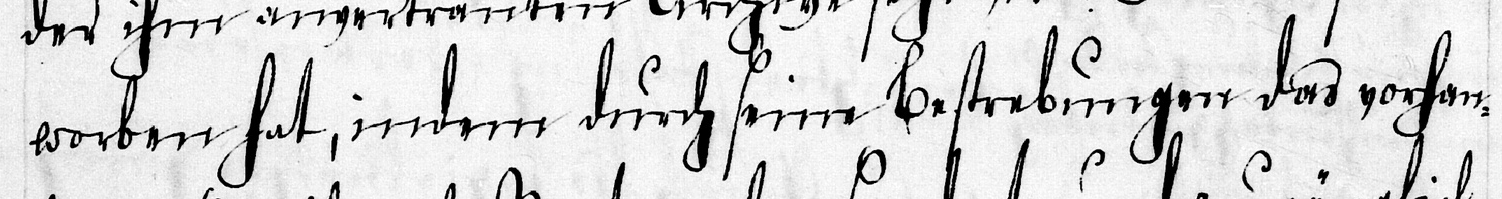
worben hat, indem durch seine Bestrebungen das vorhan¬
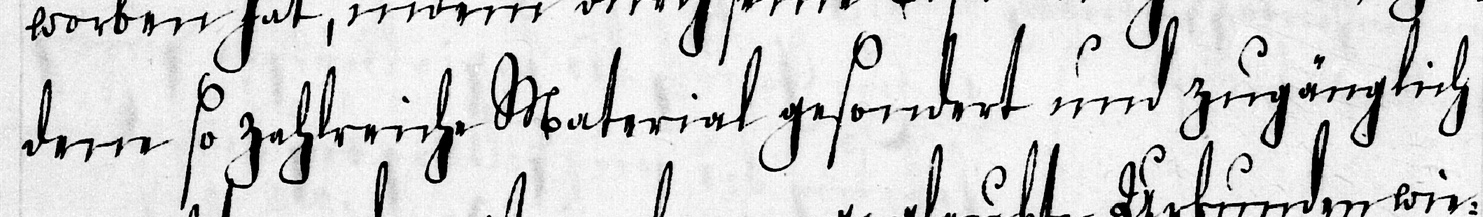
dene so zahlreiche Material gesondert und zugänglich
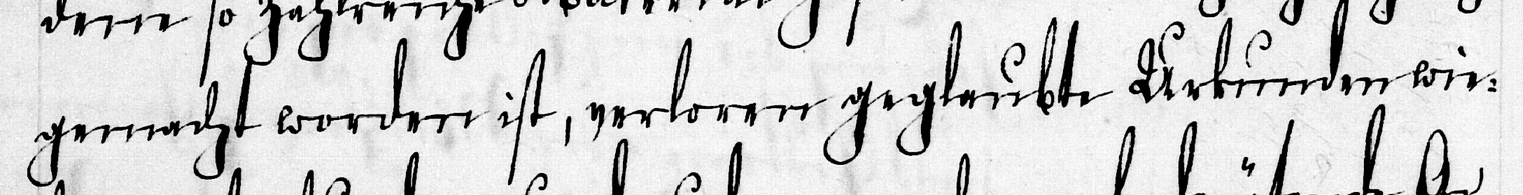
gemacht worden ist, verloren geglaubte Urkunden wie¬
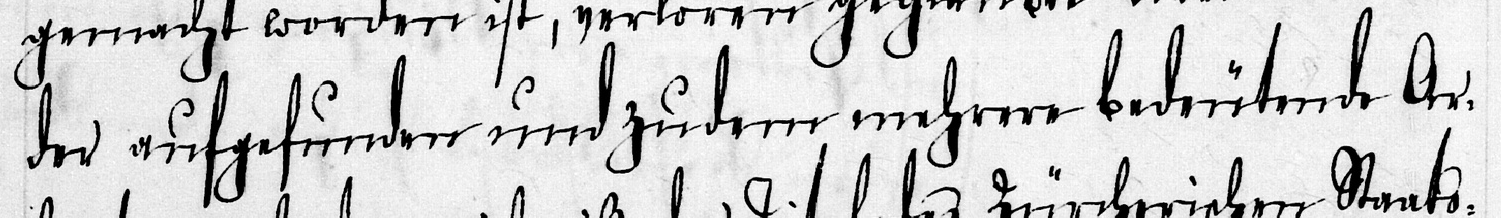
der aufgefunden und zudem mehrere bedeutende Ar¬
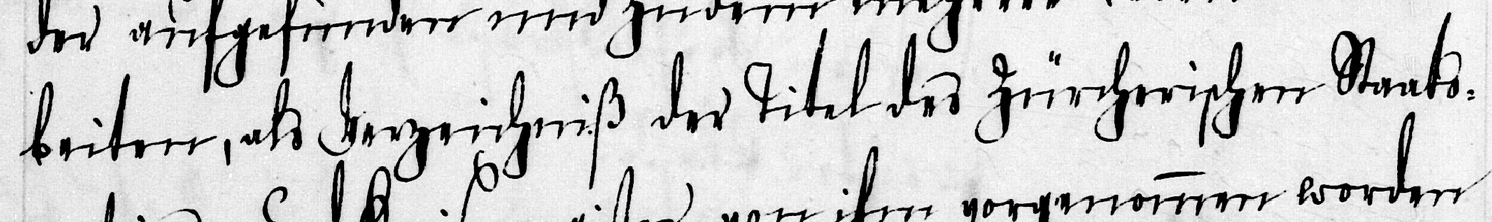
beiten, als Verzeichniß der Titel des Zürcherischen Staats¬
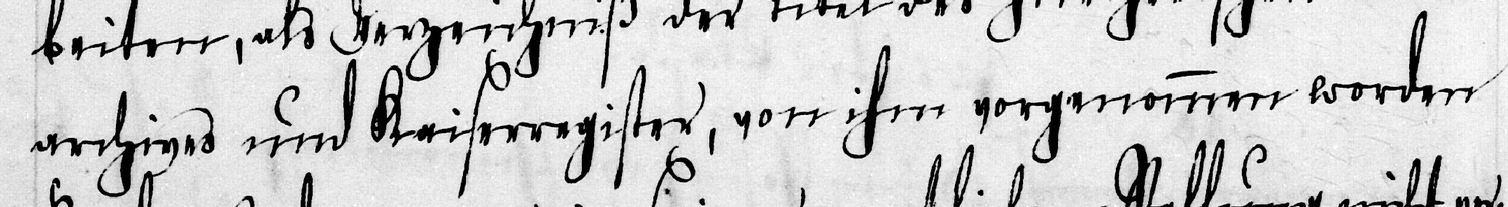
archives und Kaiserregister, von ihm vorgenommen worden
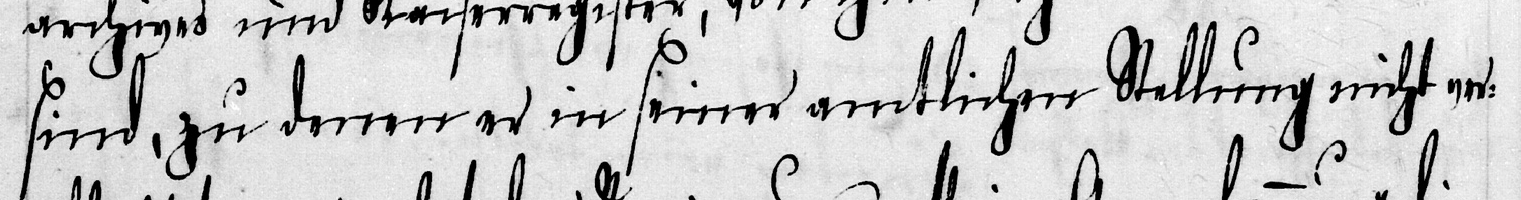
sind, zu denen er in seiner amtlichen Stellung nicht ve¬
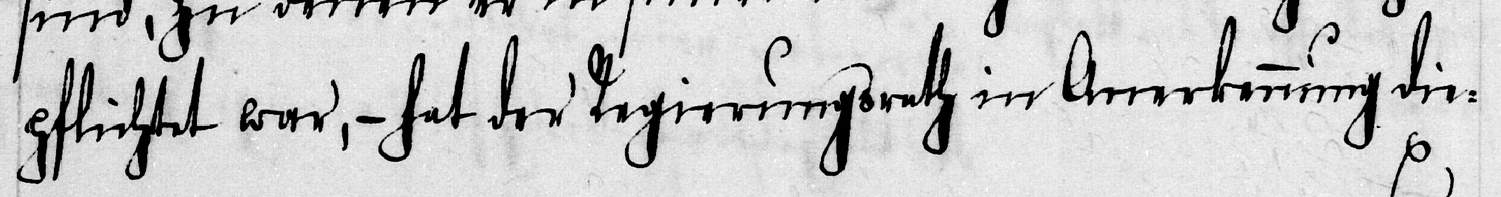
rpflichtet war, – hat der Regierungsrath in Anerkennung die-
